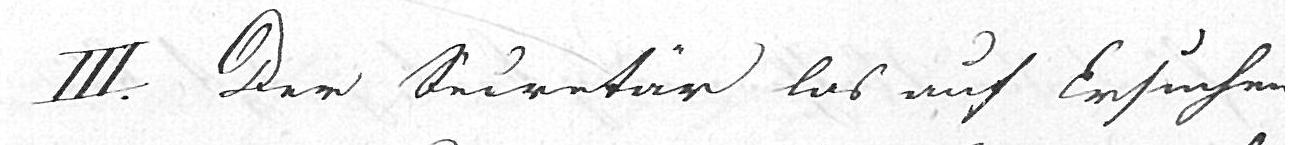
III. Der Secretär las auf Ersuchen
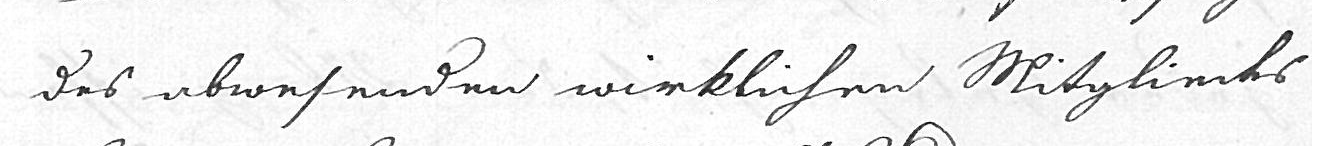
des abwesenden wirklichen Mitgliedes
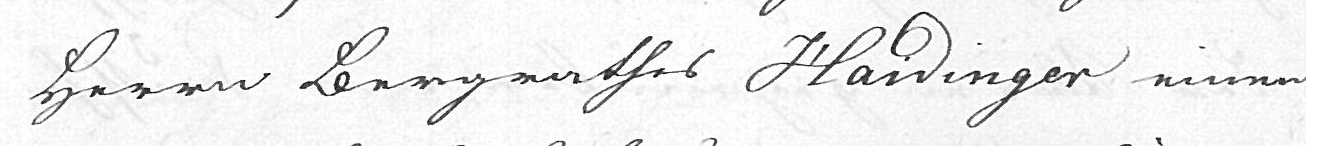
Herrn Bergrathes Haidinger einen
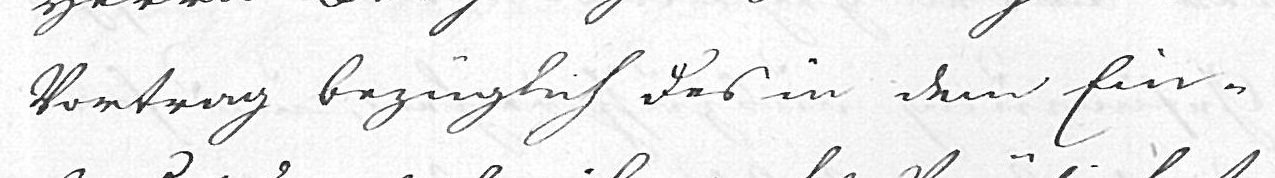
Vortrag bezüglich des in dem Ein-
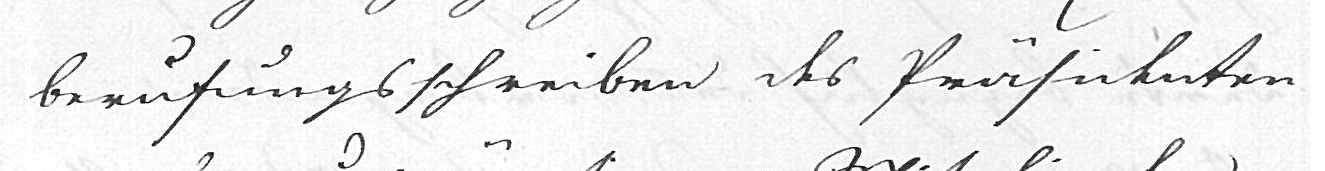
berufungsschreiben des Präsidenten
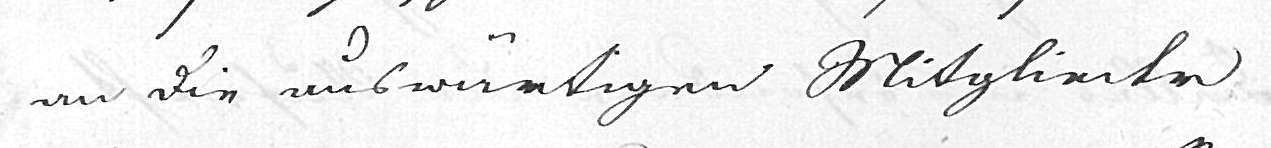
an die auswärtigen Mitglieder
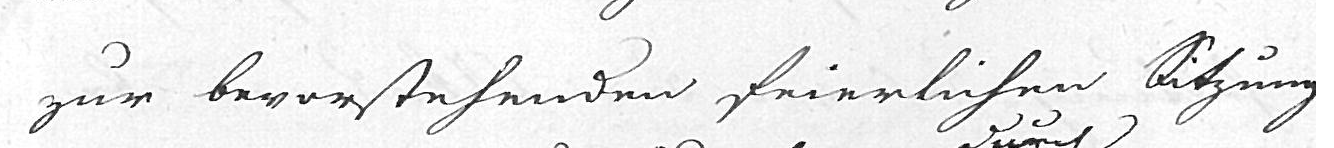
zur bevorstehenden feierlichen Sitzung
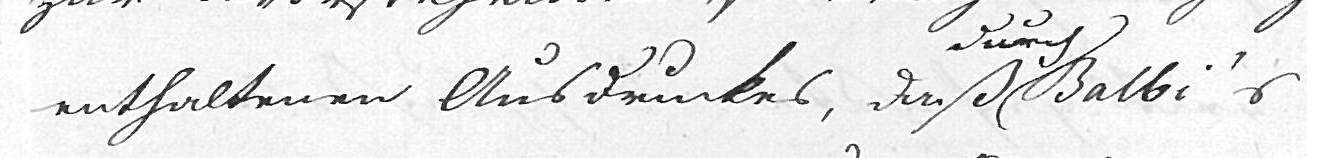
enthaltenen Ausdruckes, daß durch Balbi's
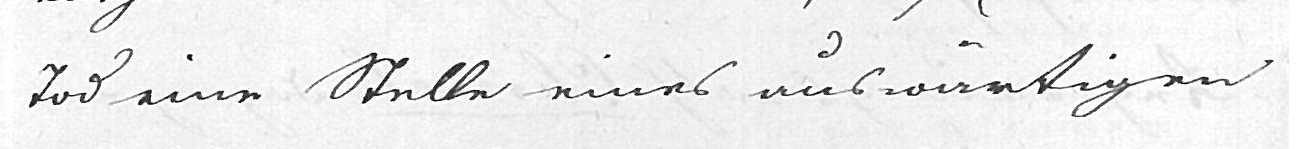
Tod eine Stelle eines auswärtigen
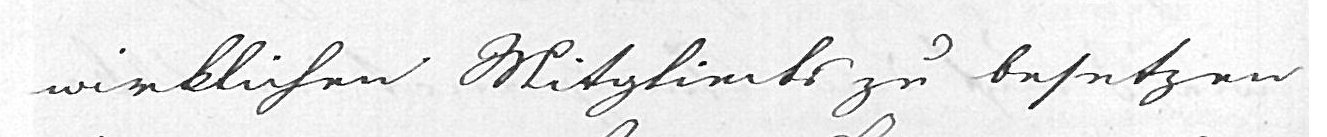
wirklichen Mitgliedes zu besetzen
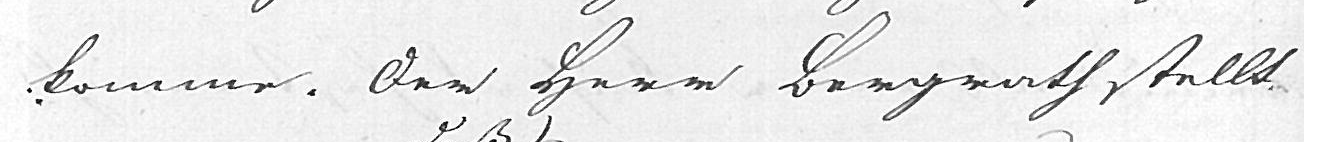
komme. Der Herr Bergrath stellt
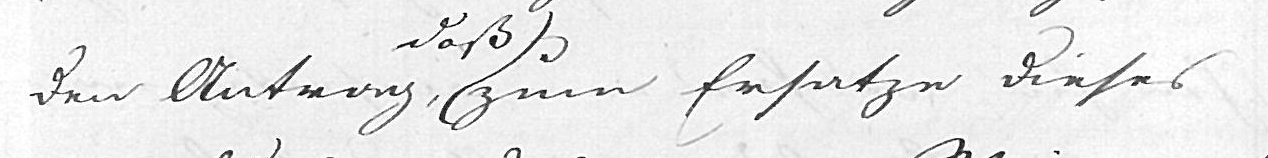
den Antrag, daß zum Ersatze dieses
